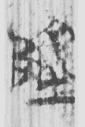{阜它土}
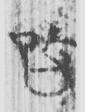攺
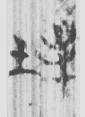{土丰}
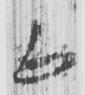㠯（以）
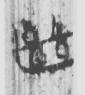㡭
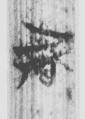者
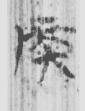侯
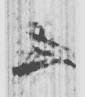之
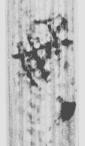好
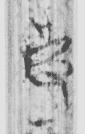皮
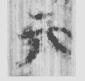亓
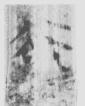行
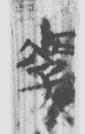李
